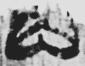因
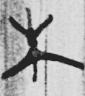木
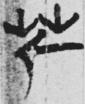苽（瓜）
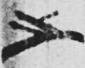之
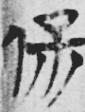保（報）
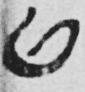㠯（以）
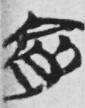俞（喻）
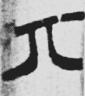亓（其）
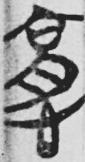惋（怨）
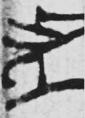者
